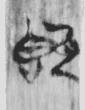既
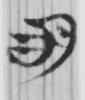明
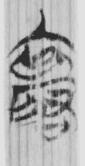{宀臣人啟}
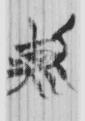劼
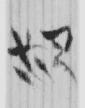{必卩}
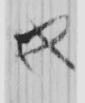女
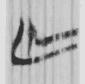亡
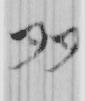多
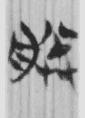朕
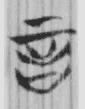言
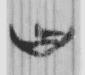曰
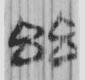𢆶
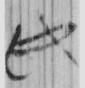女
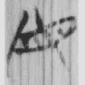母
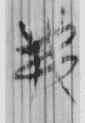弗
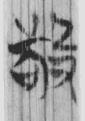敬
